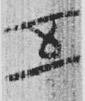五
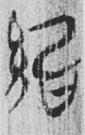○（紀）
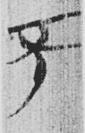不
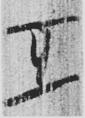工
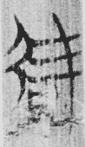唯（雖）
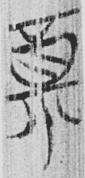福
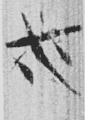必
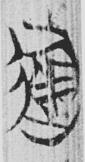○（失）
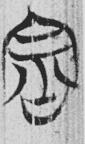○（余）
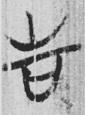告
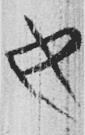女（汝）
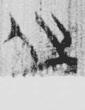○（禍）
